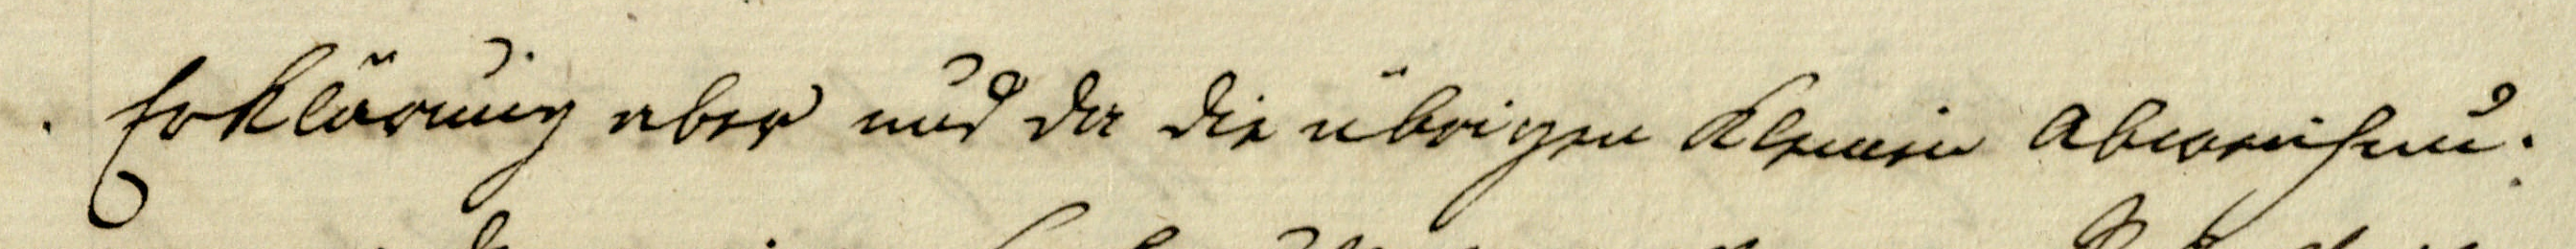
Erklärung aber und da die übrigen kleinen Abweichun¬
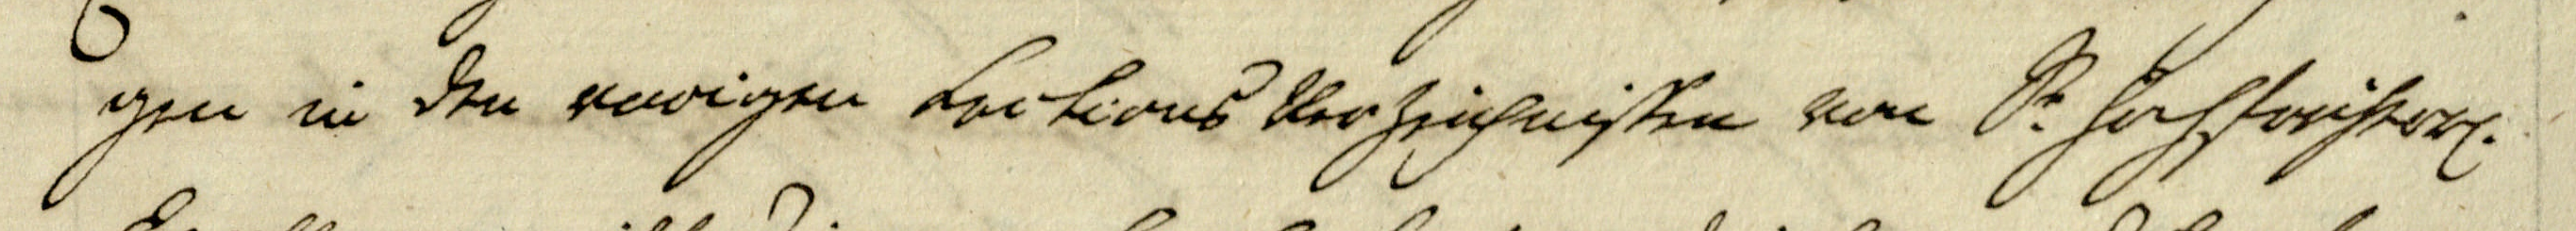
gen in den vorigen Lections Verzeichnissen von Sr hochfreiherrl.
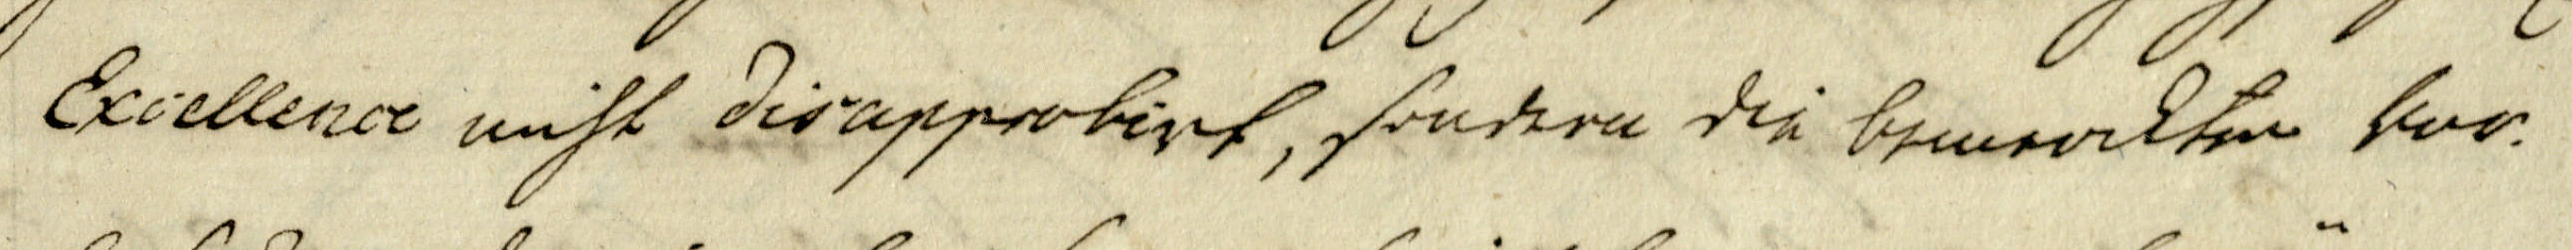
Excellence nicht disapprobirt, sondern die bemerckten Vor¬
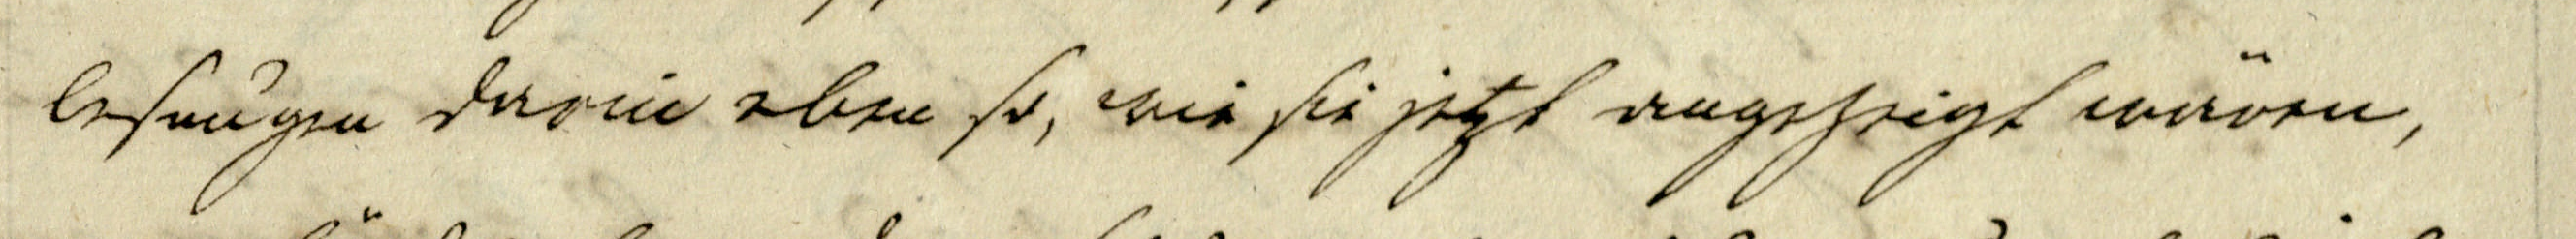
lesungen darin eben so, wie sie jetzt angezeigt wären,
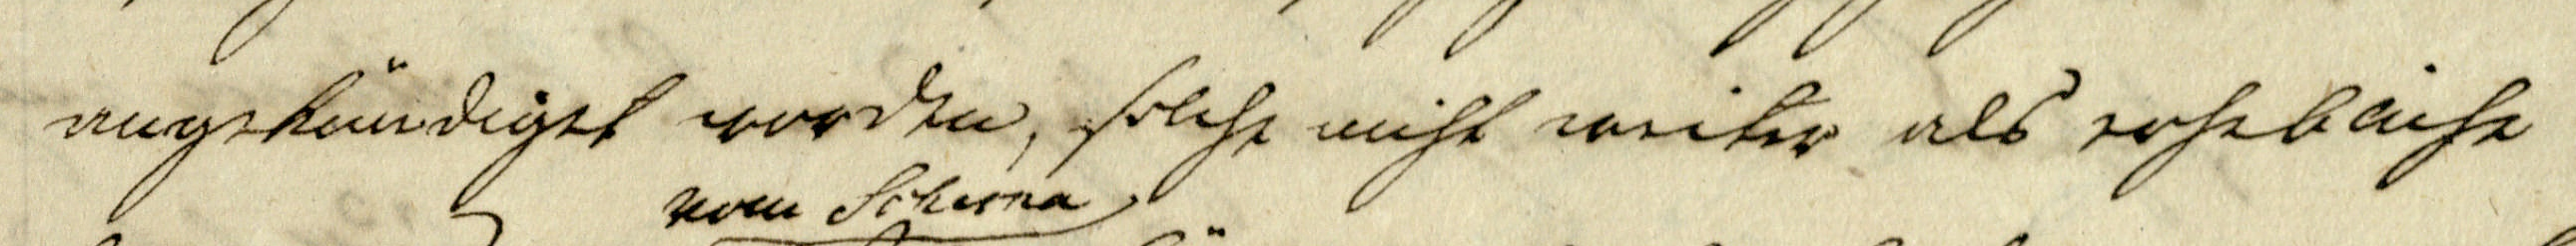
angekündiget worden, solche nicht weiter als erhebliche
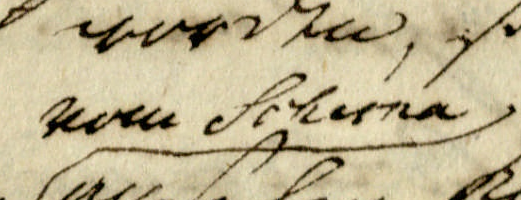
vom Schema
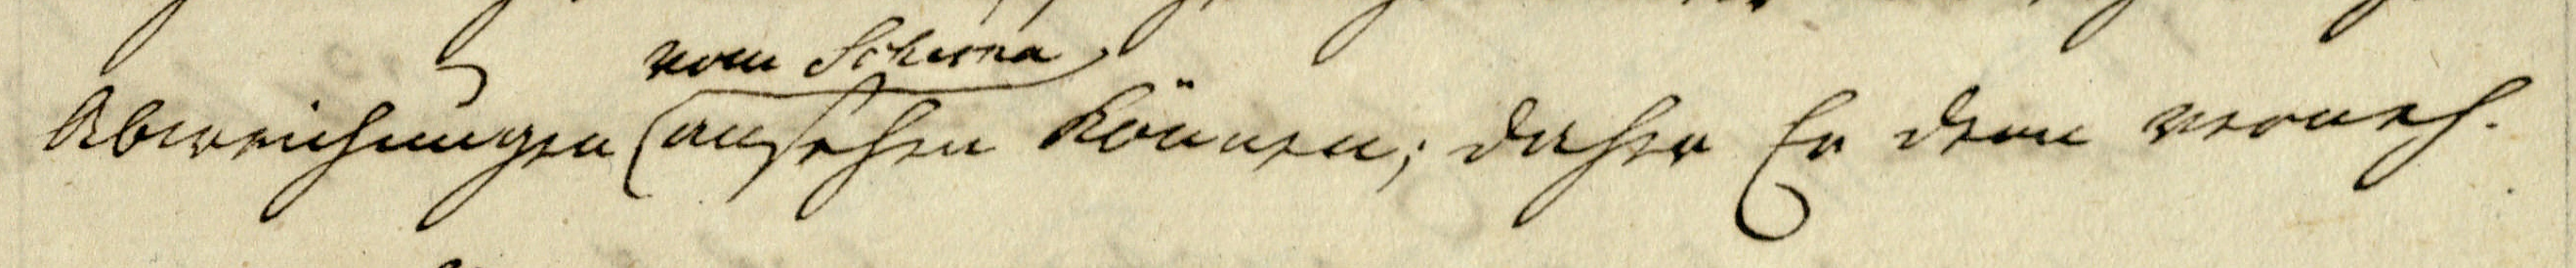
Abweichungen ansehen können, daher Er denn verneh¬
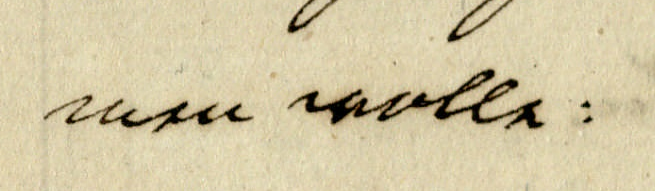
men wolle:
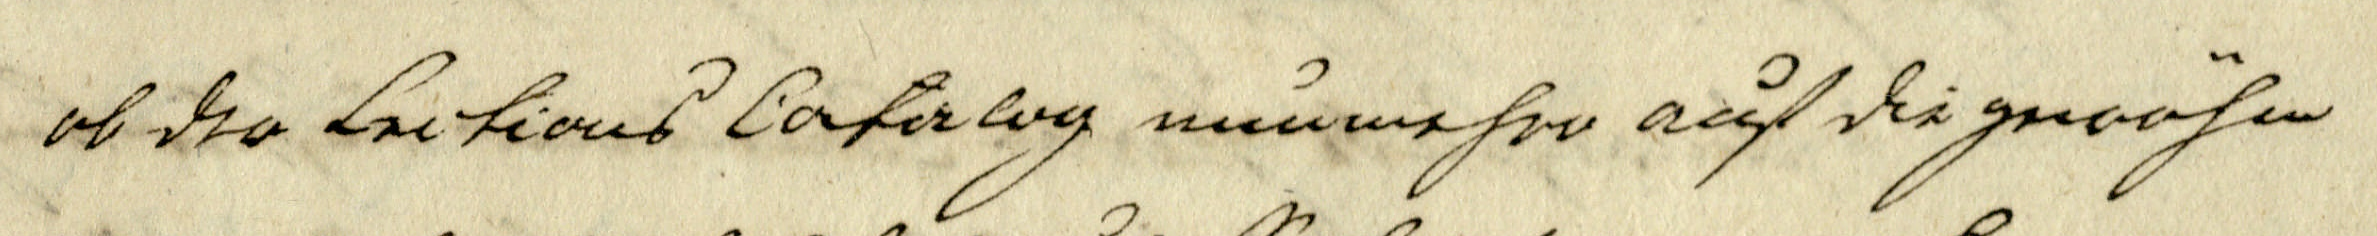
ob der Lections Catalog nunmehro auf die gewöhn¬
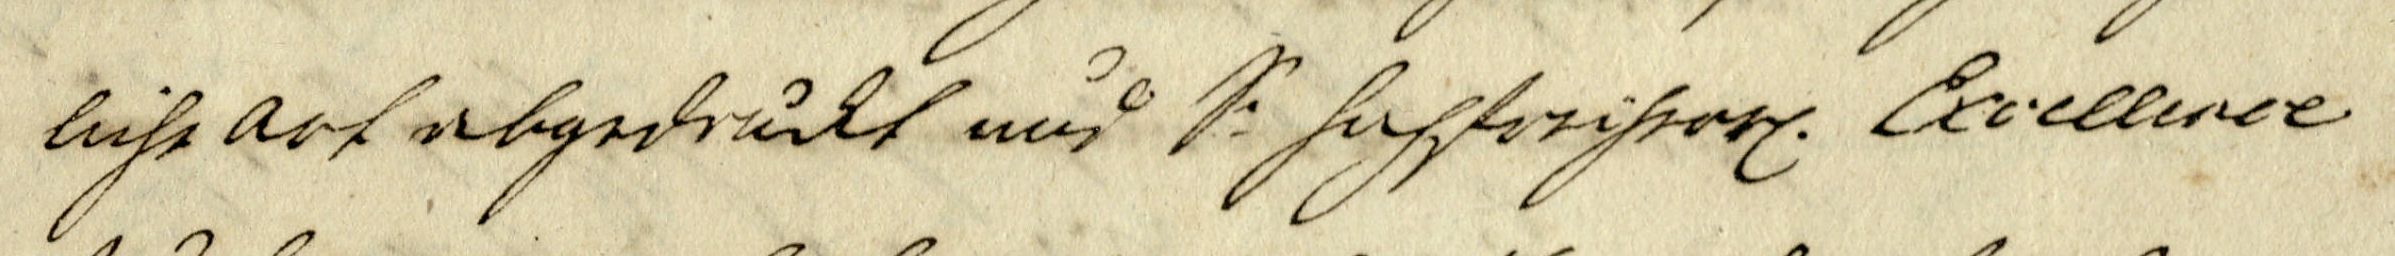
liche Art abgedruckt und Sr hochfreiherrl. Excellence
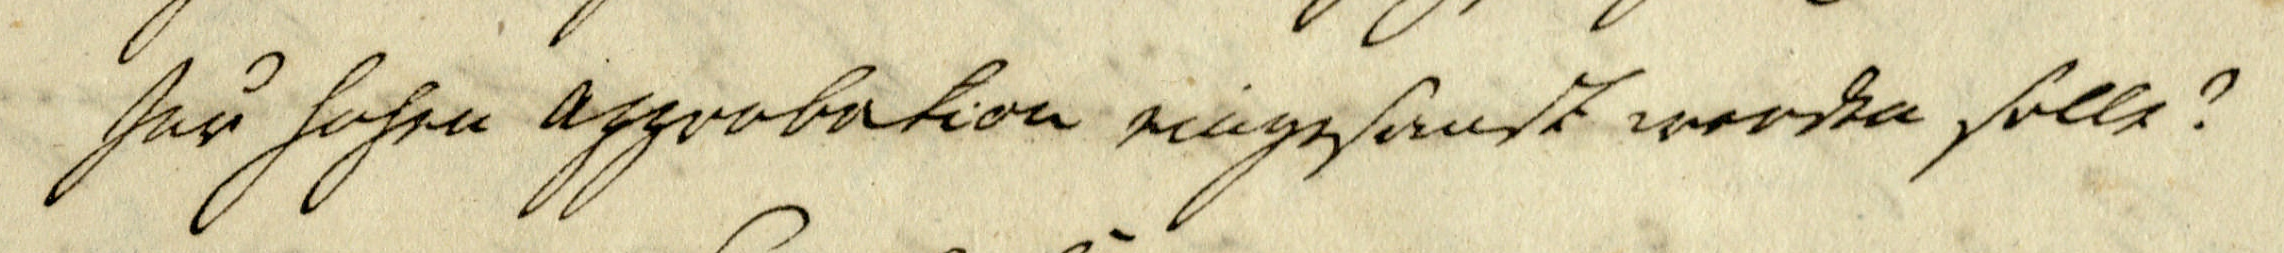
zur hohen Approbation eingesandt worden solle?
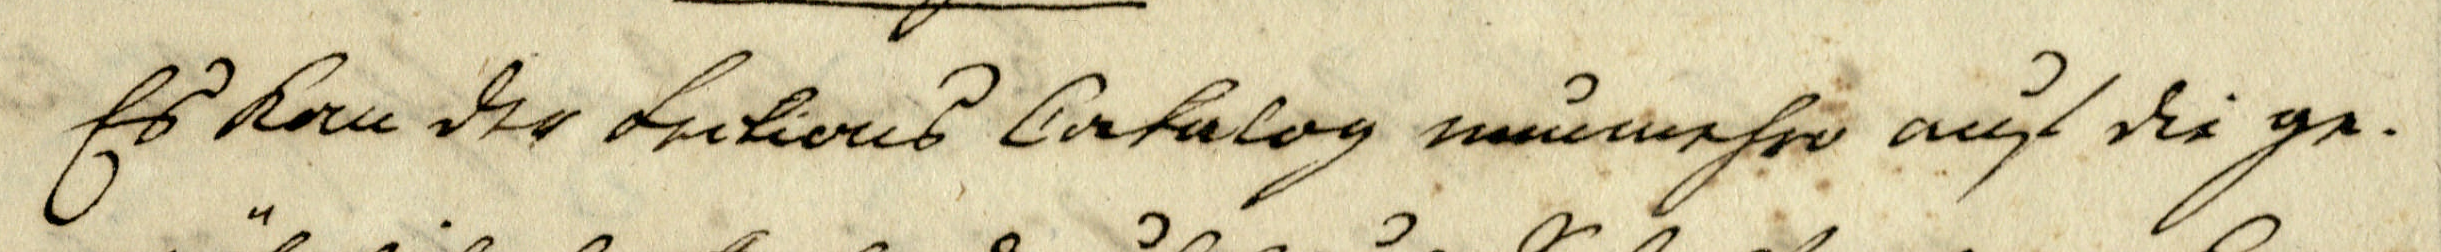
Es kan der Lections Catalog nunmehro auf die ge¬
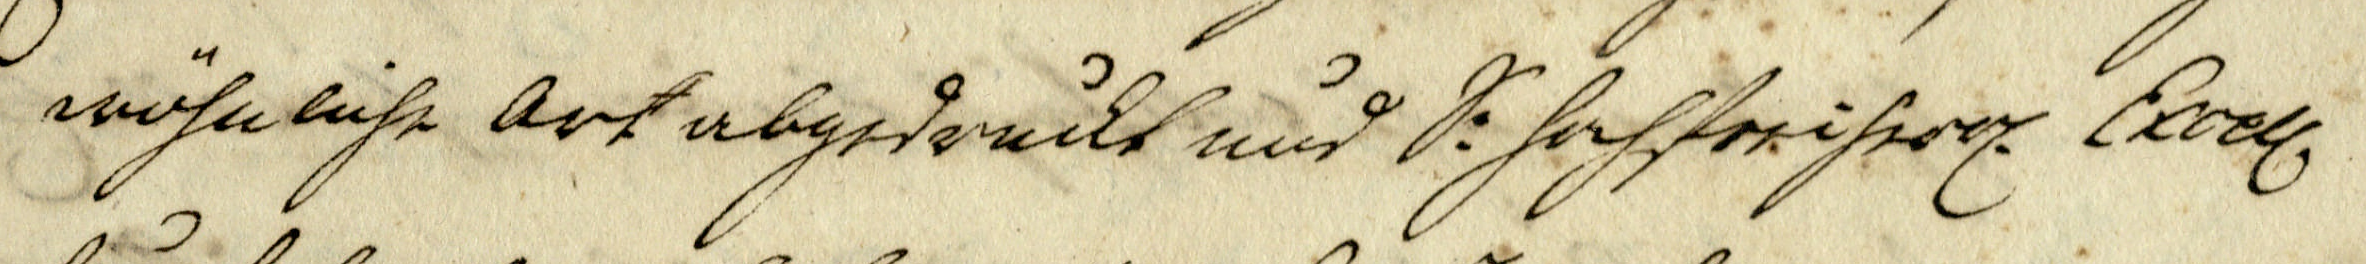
gewöhnliche Art abgedruckt und Sr. hochfreiherrl Excel.
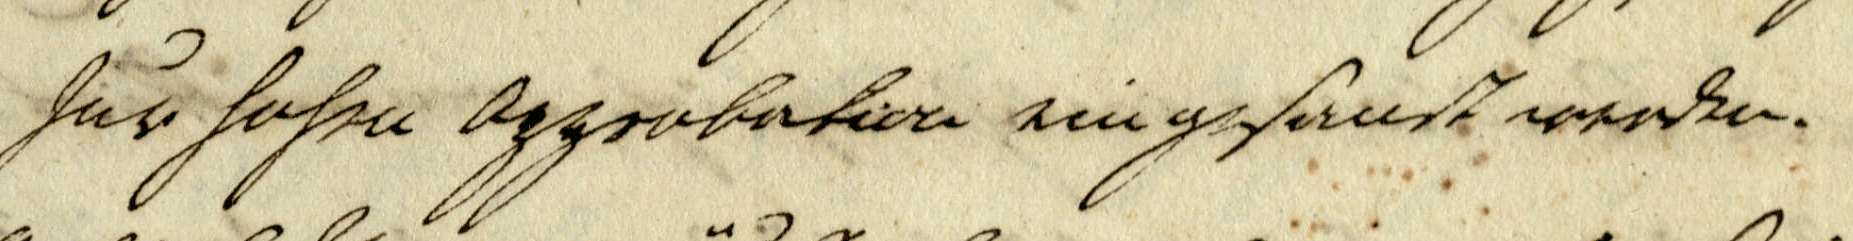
zur hohen Approbation eingesandt werden.
